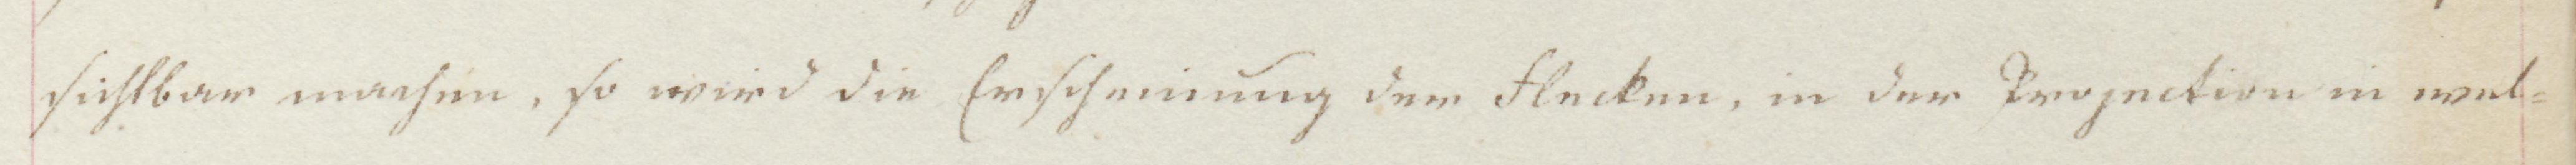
sichtbar machen, so wird die Erscheinung der Flecken, in der Projection in wel-
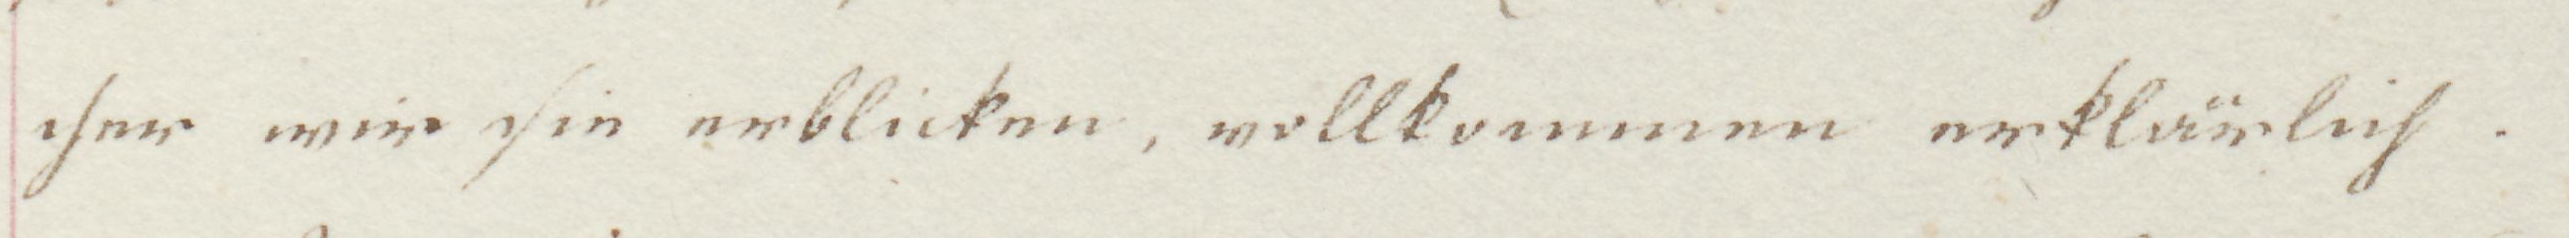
cher wir sie erblicken, vollkommen erklärlich.
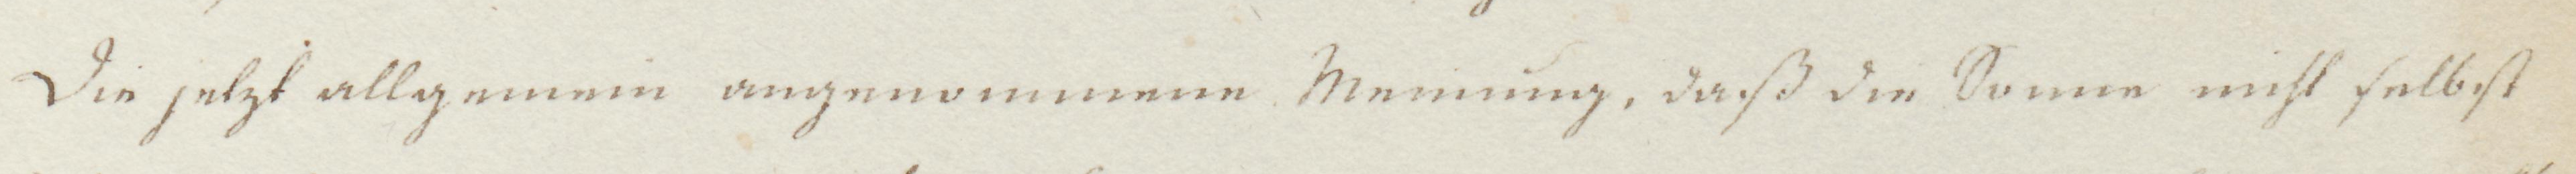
Die jetzt allgemein angenommene Meinung, daß die Sonne nicht selbst
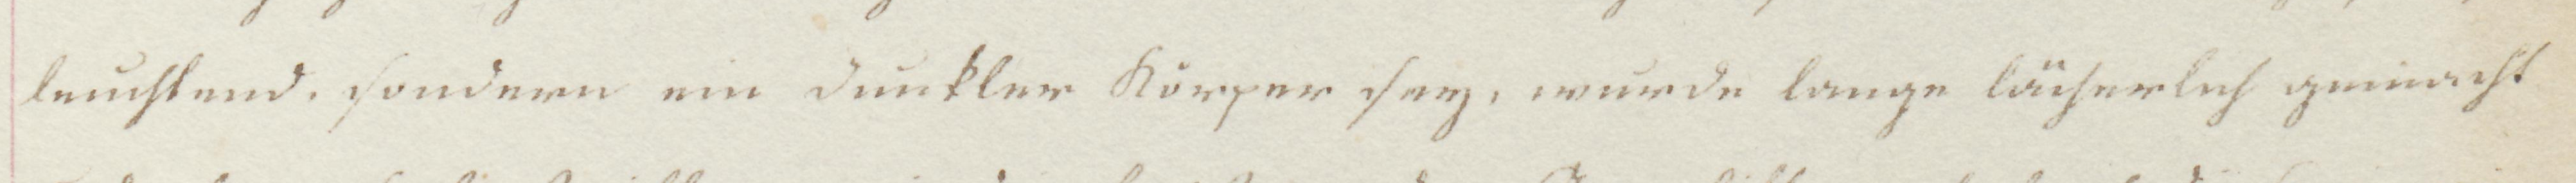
leuchtend, sondern ein dunkler Körper sey, wurde lange lächerlich gemacht
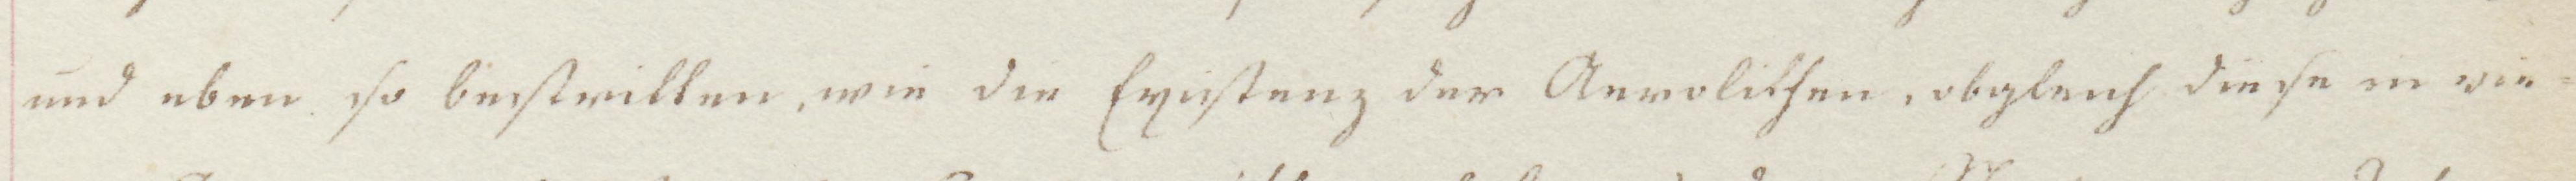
und eben so bestritten, wie die Existenz der Aerolithen, obgleich diese in vie-
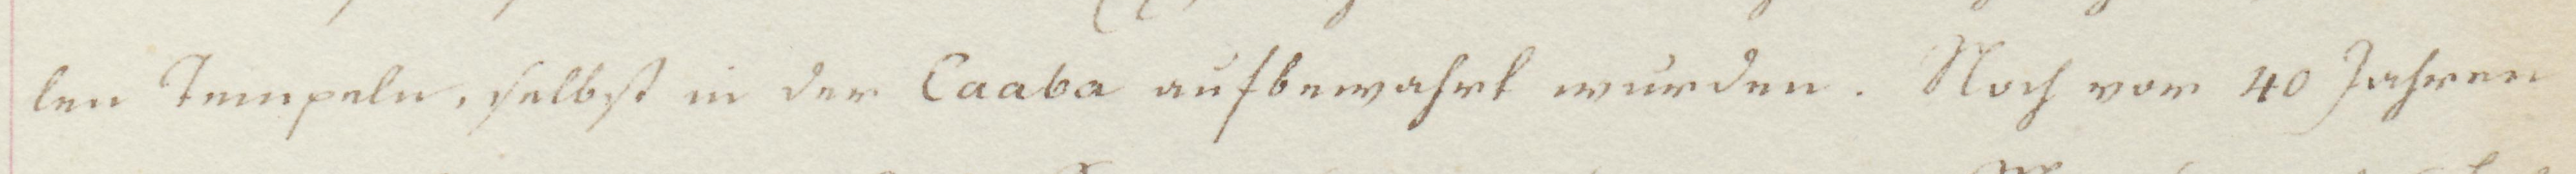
len Tempeln, selbst in der Caaba aufbewahrt wurden. Noch vor 40 Jahren
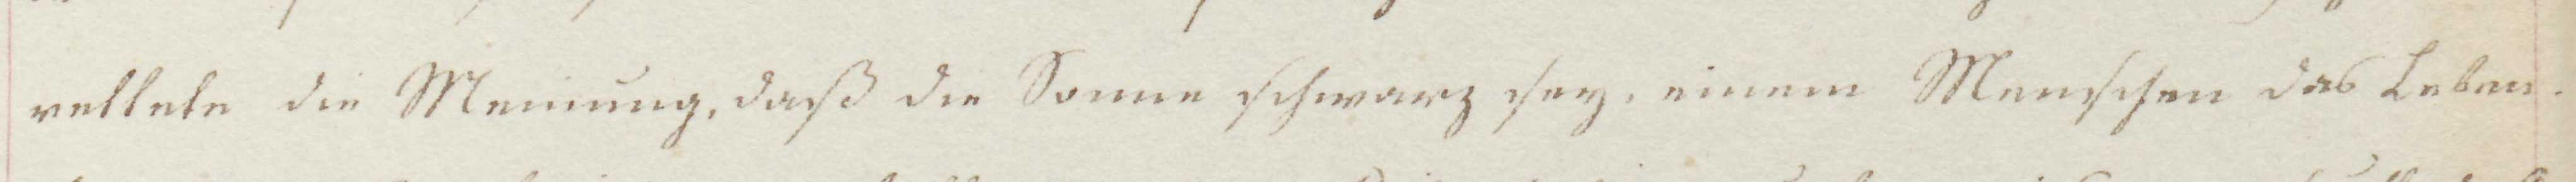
rettete die Meinung, daß die Sonne schwarz sey, einem Menschen das Leben.
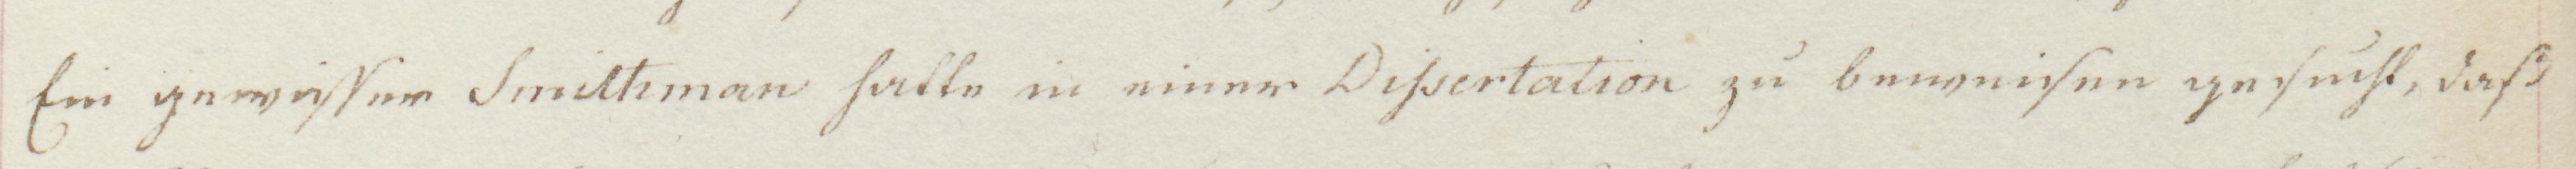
Ein gewisser Smithman hatte in einer Dissertation zu beweisen gesucht, daß
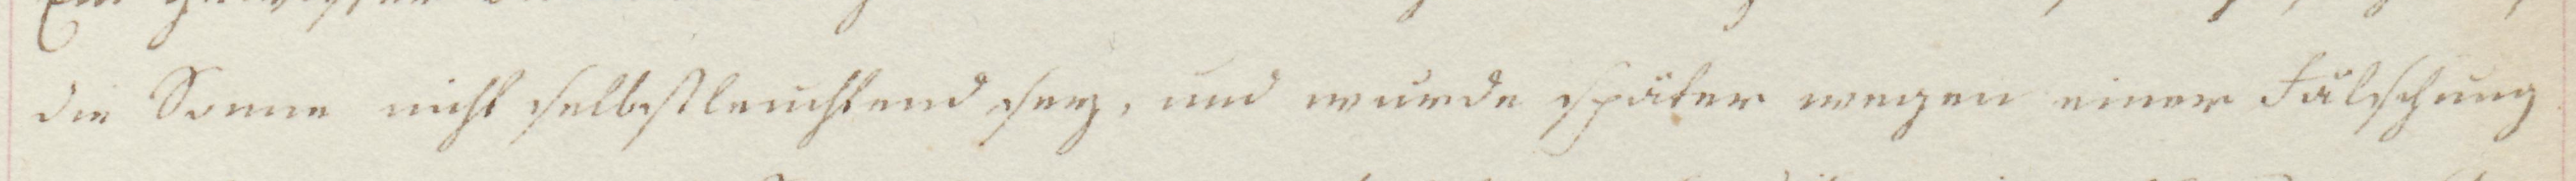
die Sonne nicht selbstleuchtend sey, und wurde später wegen einer Fälschung
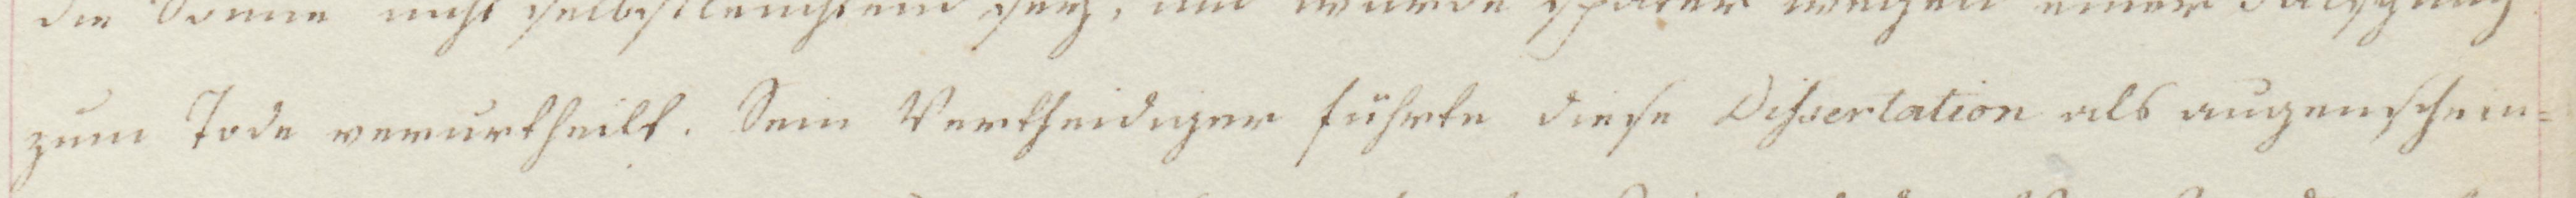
zum Tode verurtheilt. Sein Verteidiger führte diese Dissertation als augenschein-
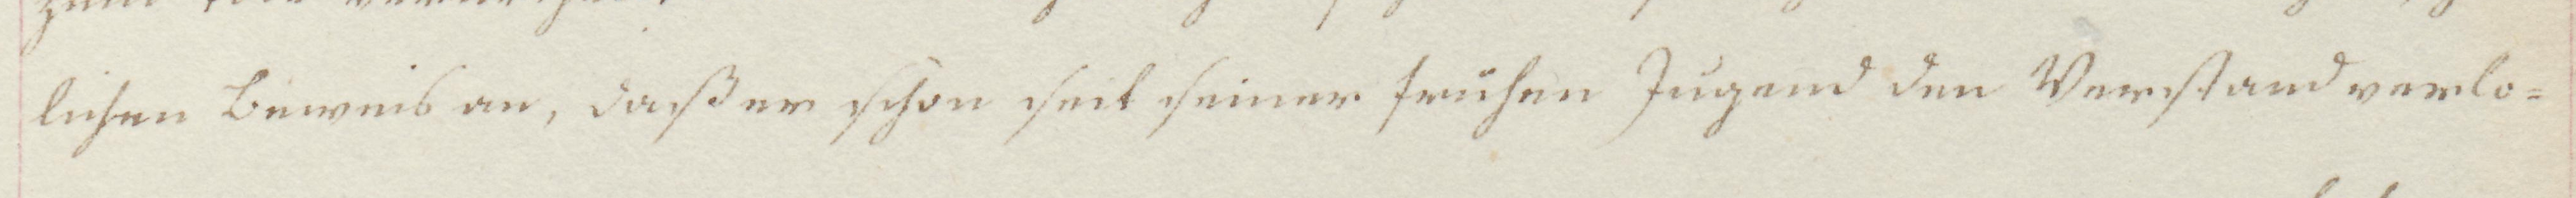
lichen Beweis an, daß er schon seit seiner frühen Jugend den Verstand verlo-
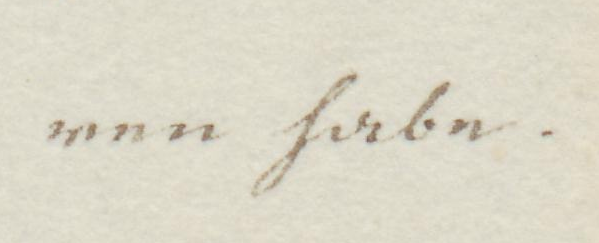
ren habe.
